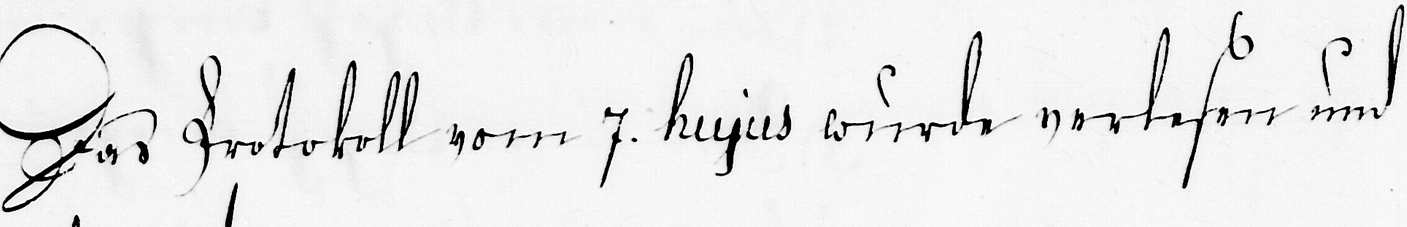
Das Protokoll vom 7. hujus wurde verlesen und
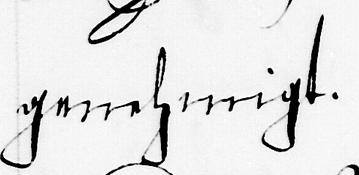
genehmigt.
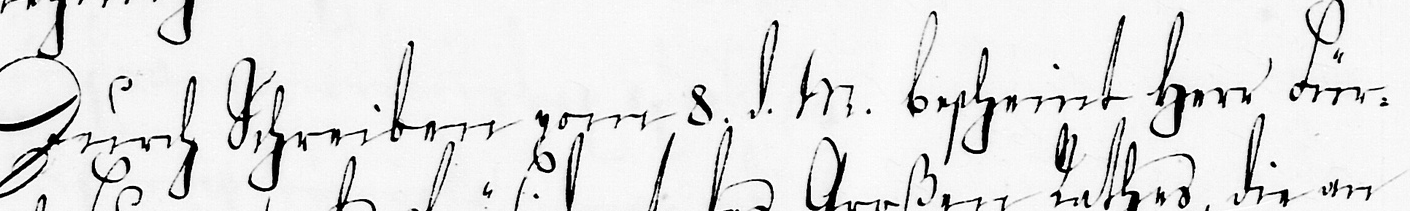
Durch Schreiben vom 8. d. M. bescheint Herr Für¬
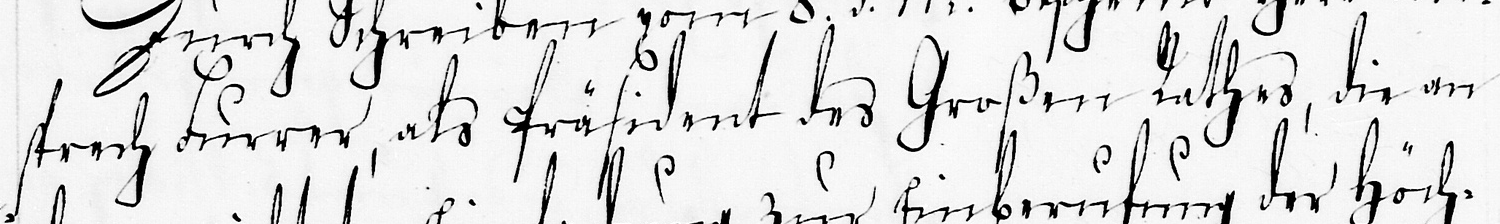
sprech Furrer, als Präsident des Großen Rathes, die an
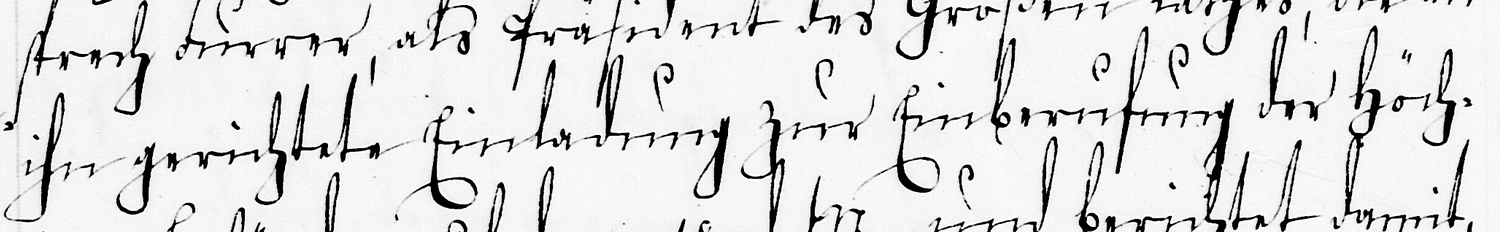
ihn gerichtete Einladung zur Einberufung der Höch¬
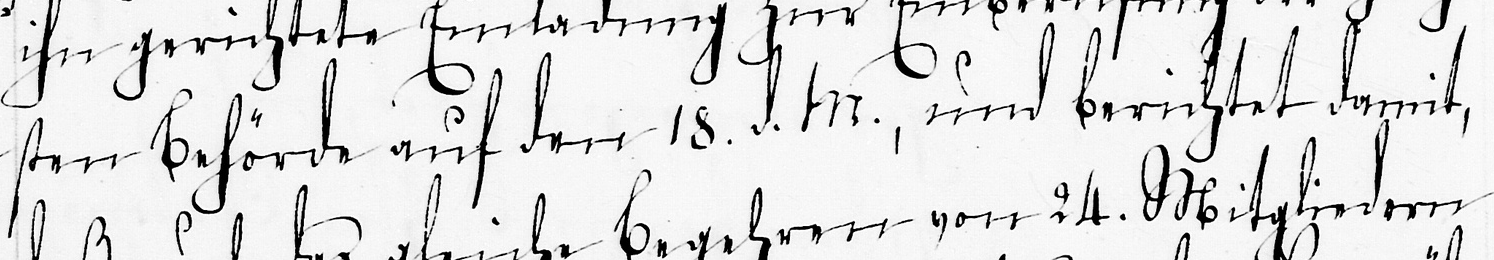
sten Behörde auf den 18. d. M., und berichtet damit,
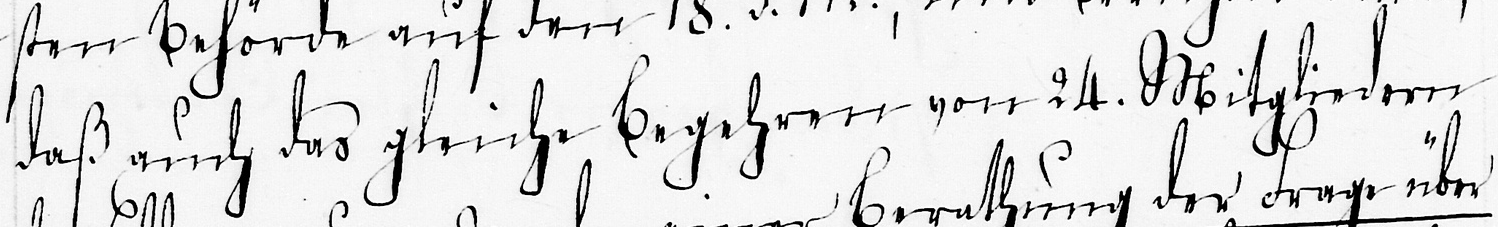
daß auch das gleiche Begehren von 24. Mitgliedern
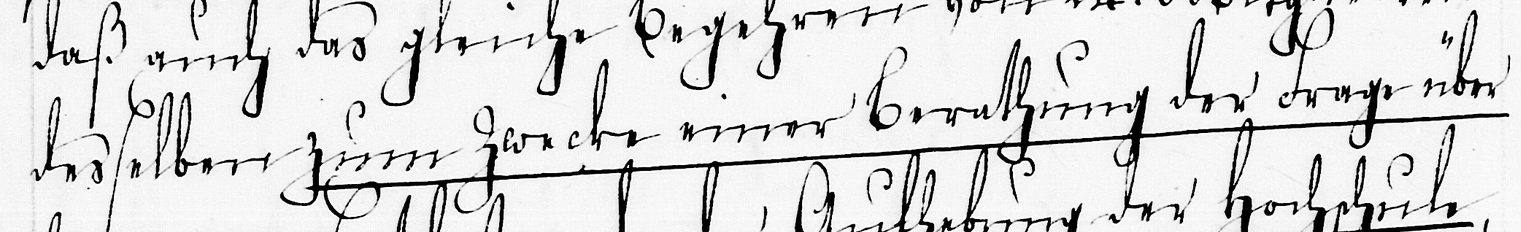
desselben zum Zwecke einer Berathung der Frage über
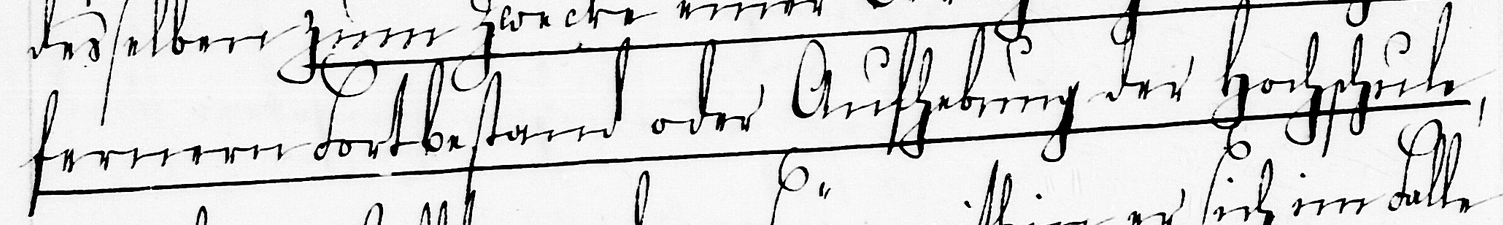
fernern Fortbestand oder Aufhebung der Hochschul¬
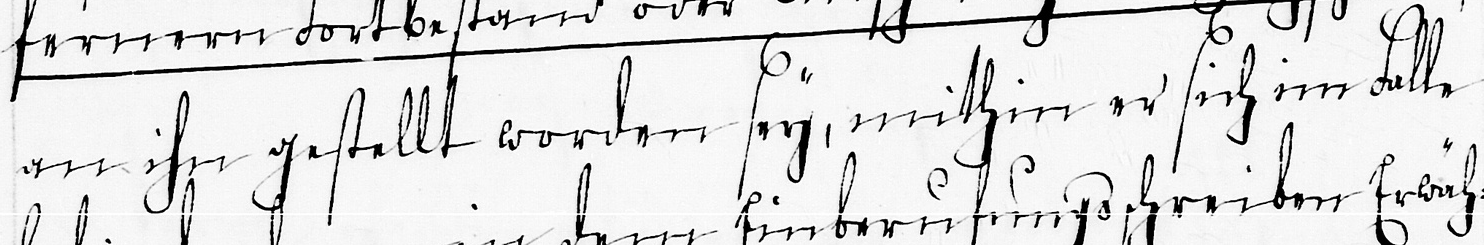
an ihn gestellt worden sey, mithin er sich im Falle
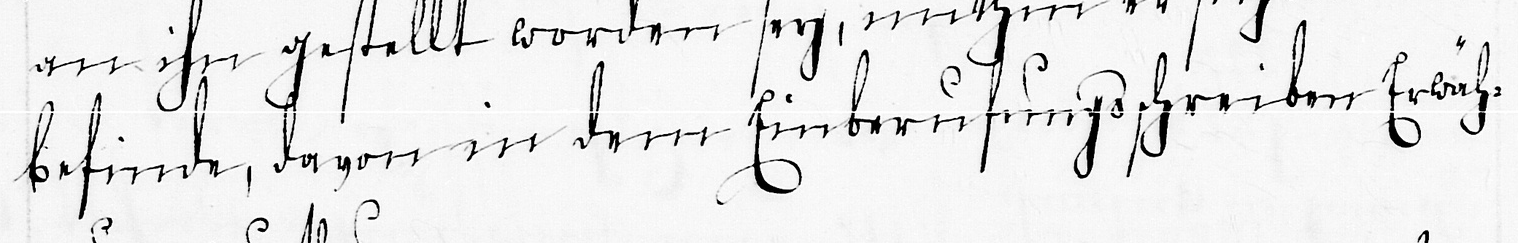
befinde, davon in dem Einberufungsschreiben Erwäh¬
